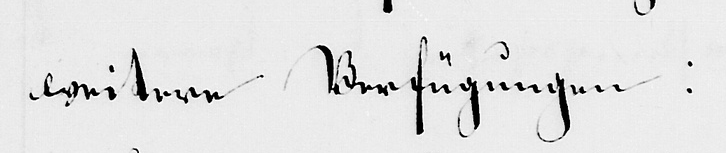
weitere Verfügungen:
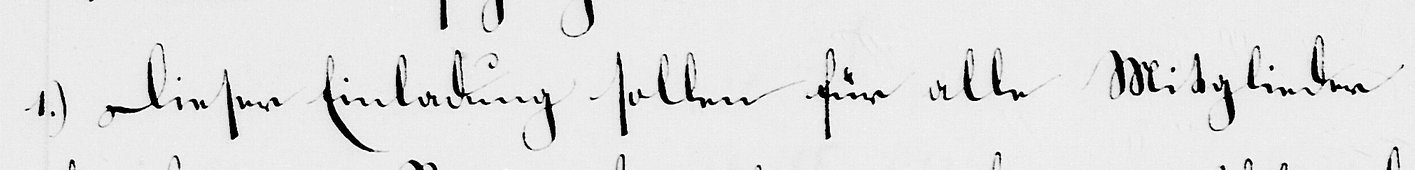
1.) Dieser Einladung sollen für alle Mitglieder
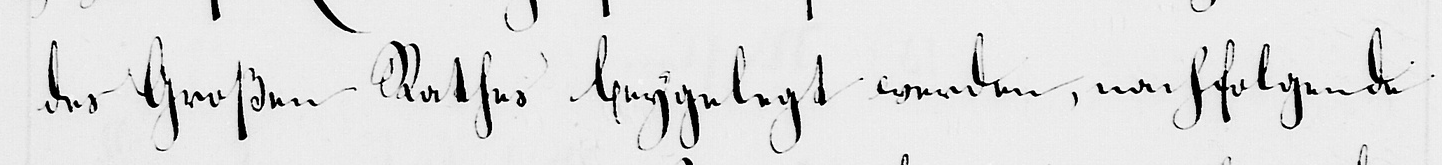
des Großen Rathes beygelegt werden, nachfolgende
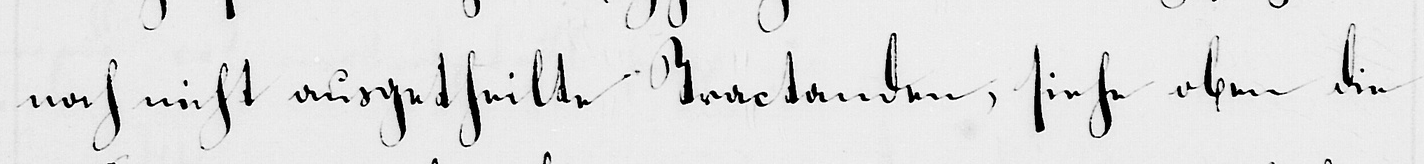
noch nicht ausgetheilte Tractanden, siehe oben die
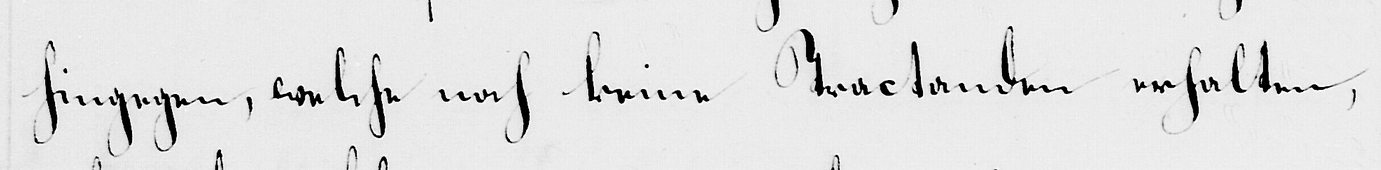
hingegen, welche noch keine Tractanden erhalten,
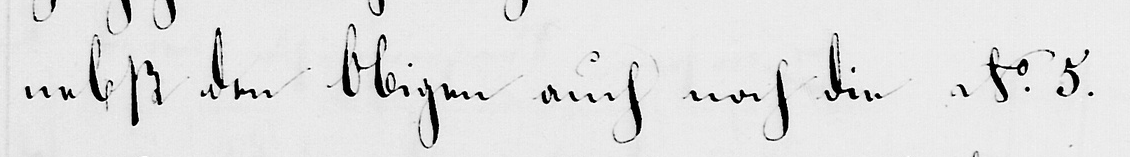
nebst den Obigen auch noch die N°. 5.
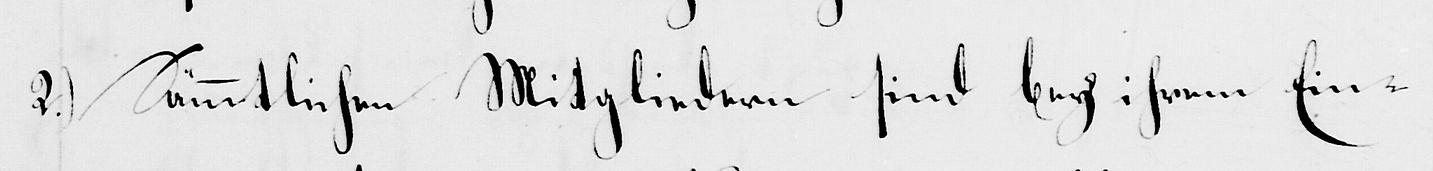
2.) Sämmtlichen Mitgliedern sind bey ihrem Ein¬
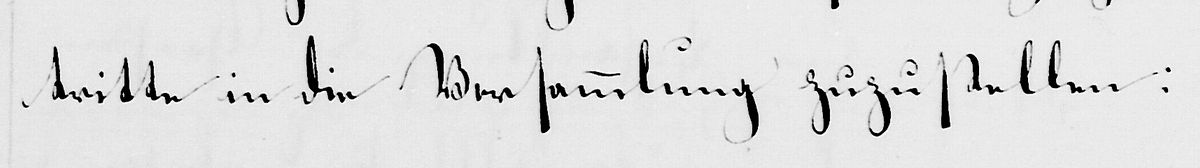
tritte in die Versammlung zuzustellen:
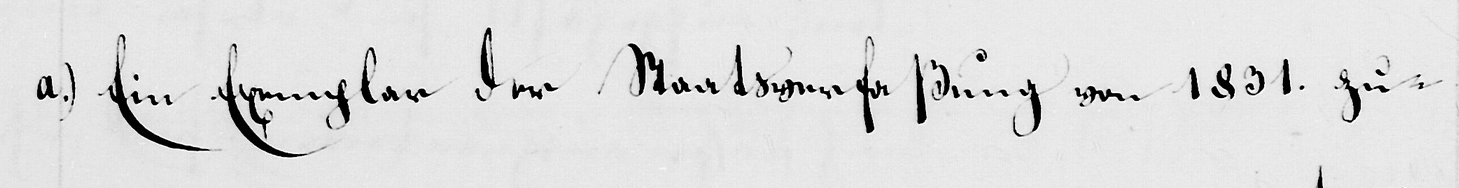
a.) Ein Exemplar der Staatsverfaßung von 1831. zu-
